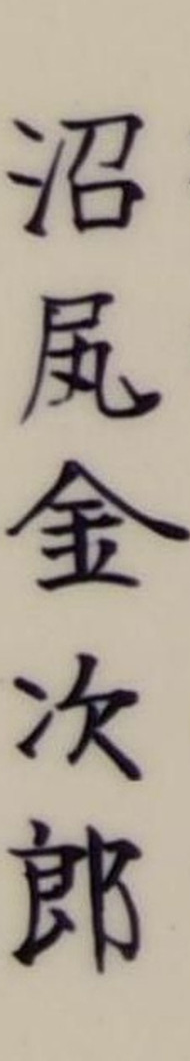沼尻金次郎
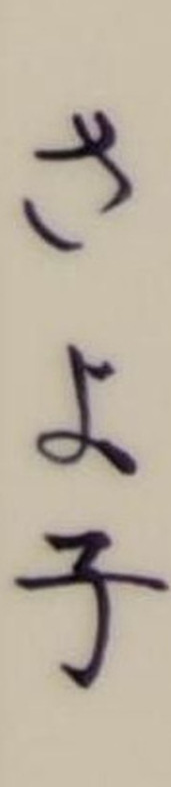さよ子

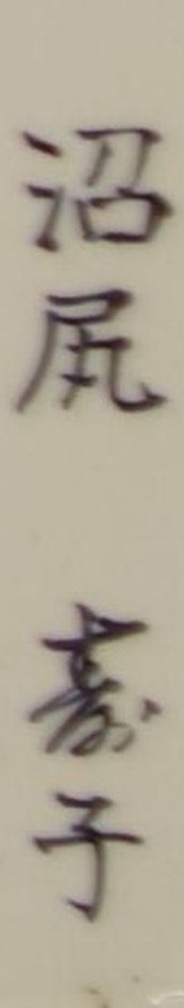沼尻寿子
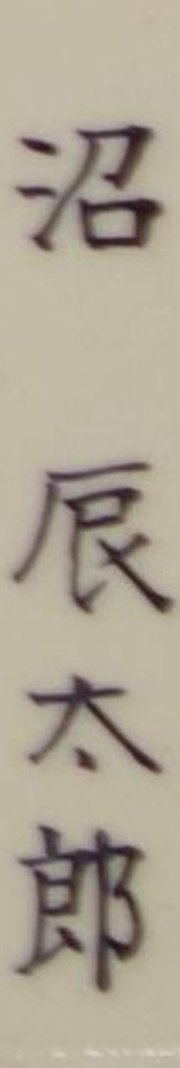沼辰太郎
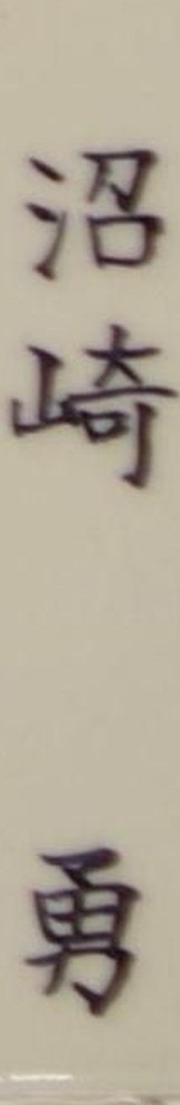沼崎勇
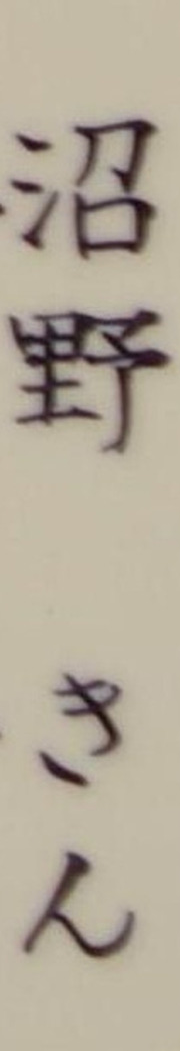沼野きん
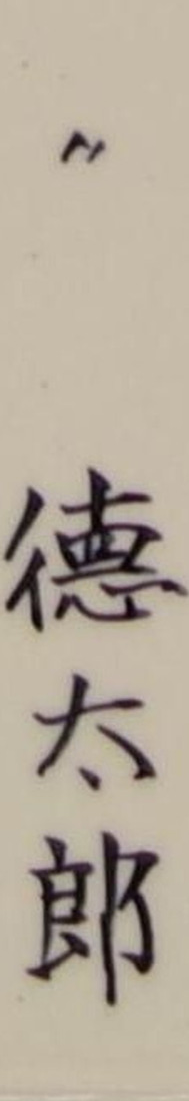徳太郎
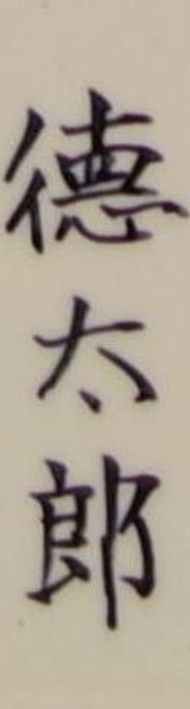徳太郎
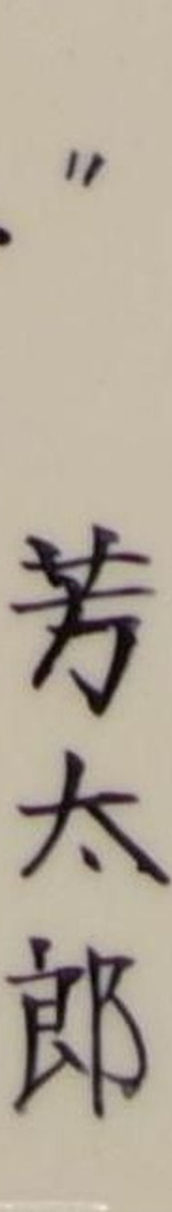芳太郎
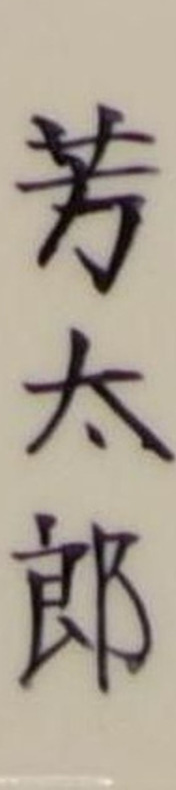芳太郎
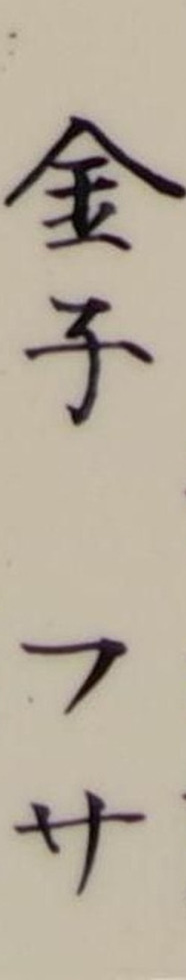金子フサ
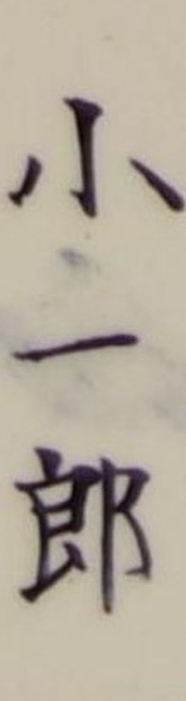小一郎
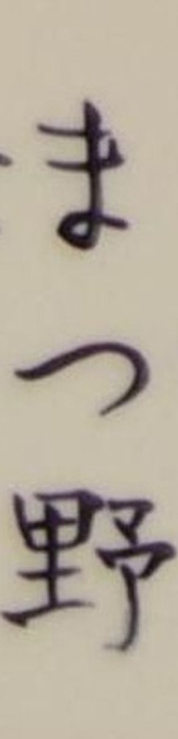まつ野
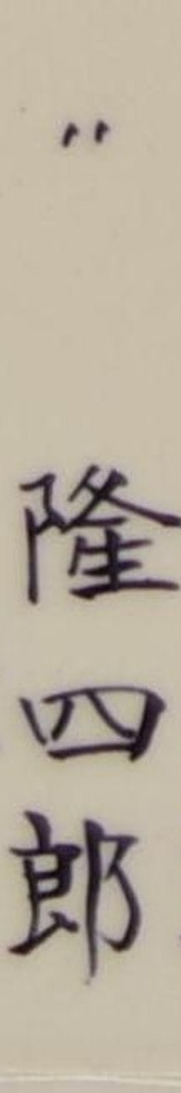隆四郎
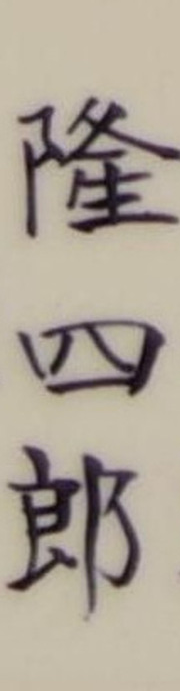隆四郎

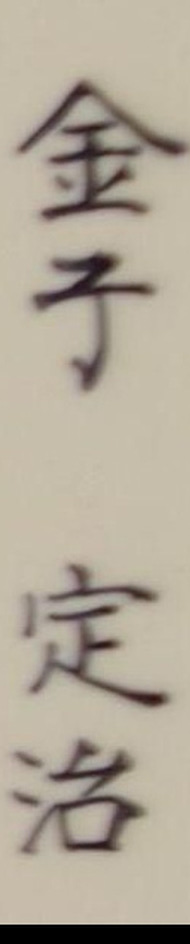金子定治
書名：M~S
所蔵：高野山金剛峯寺
